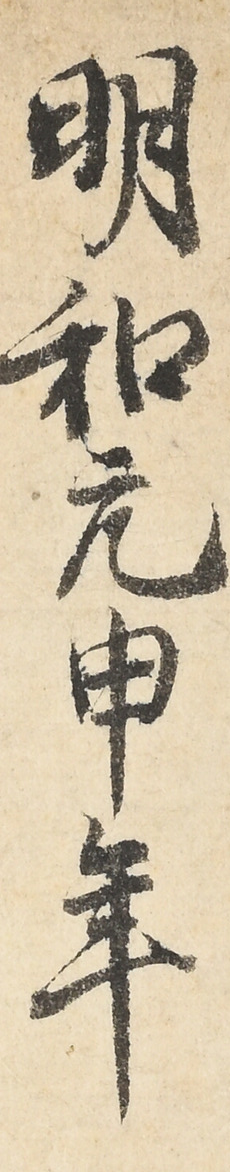明和元申年
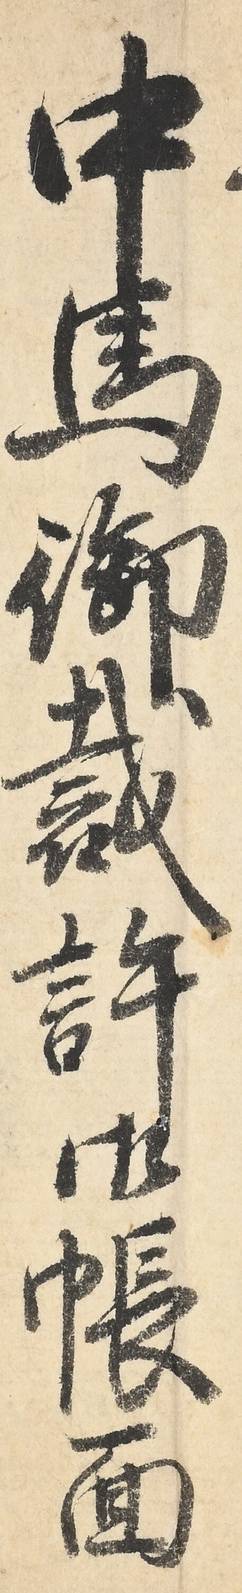中馬御裁許御帳面

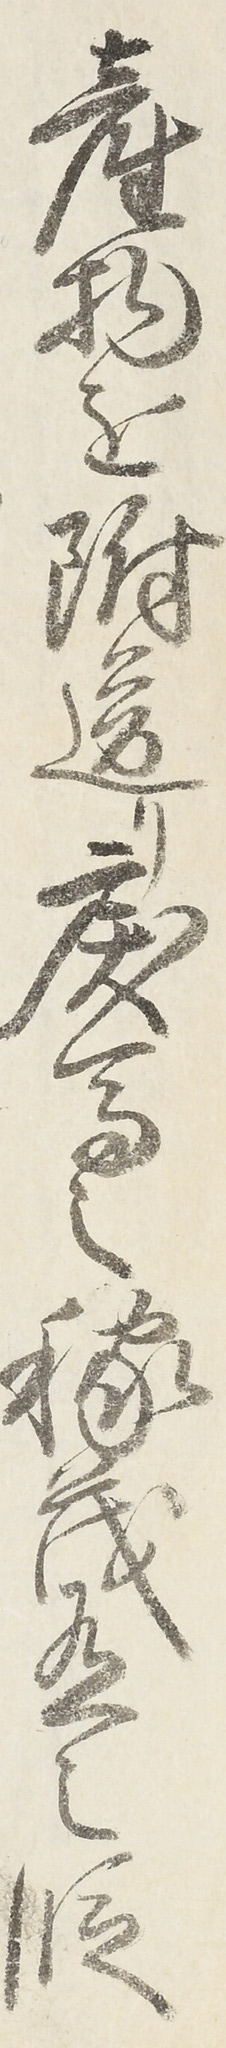産物を附送り戻馬之稼も有之段
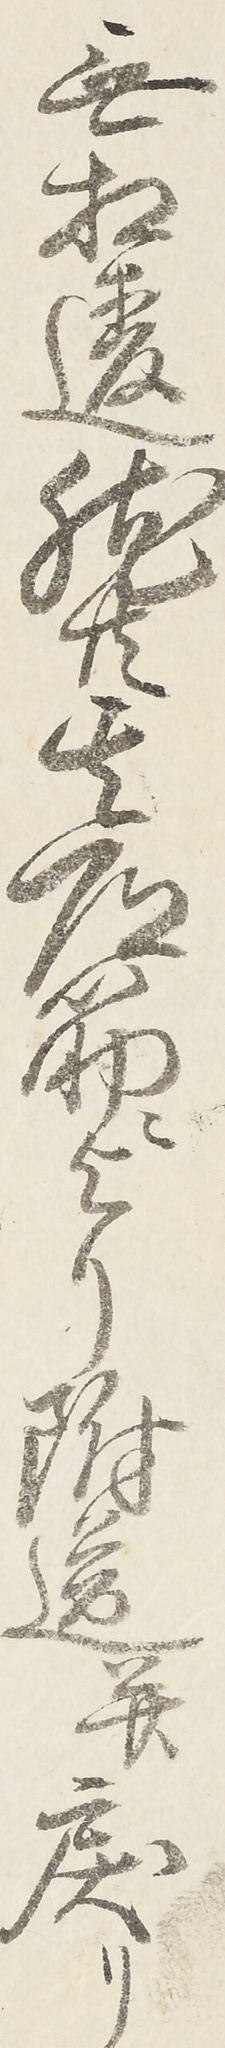無相違然共其道筋ニより附送并戻り
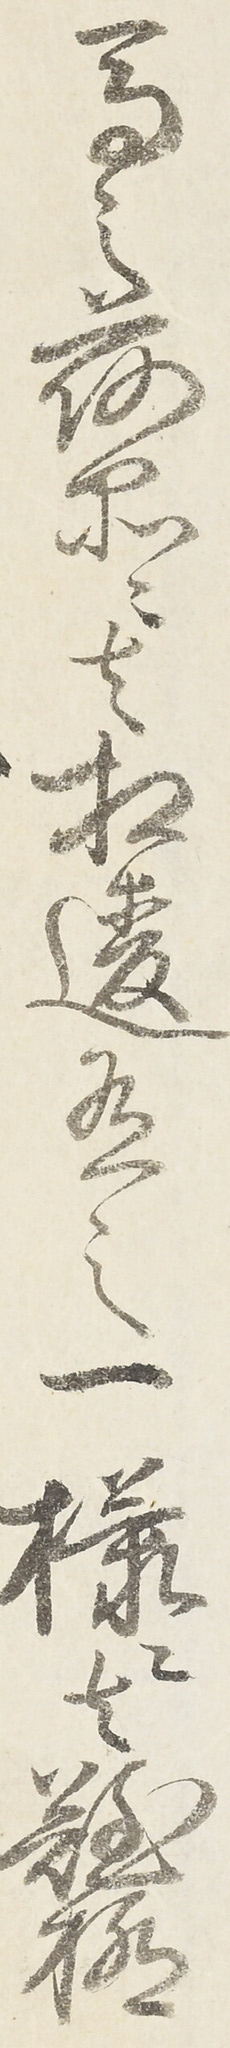馬之荷品ニは相違有之一様ニは難極
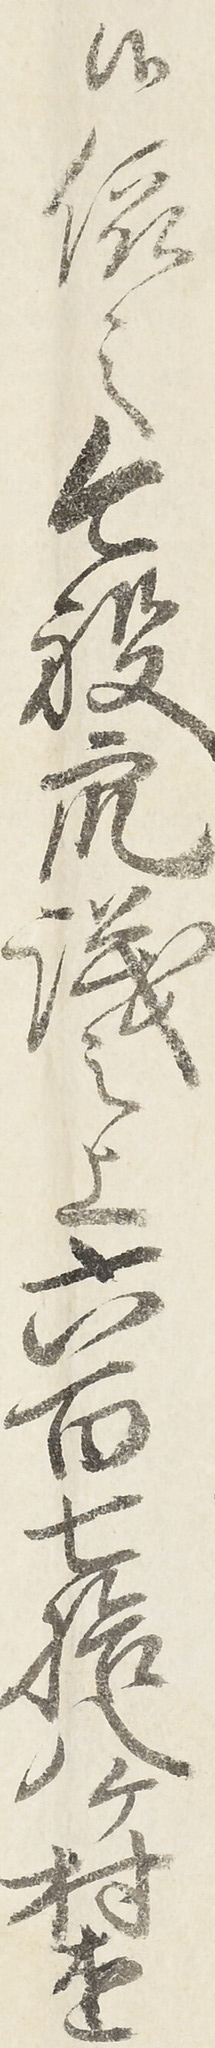候依之今般衆議之上六百七拾八ヶ村を
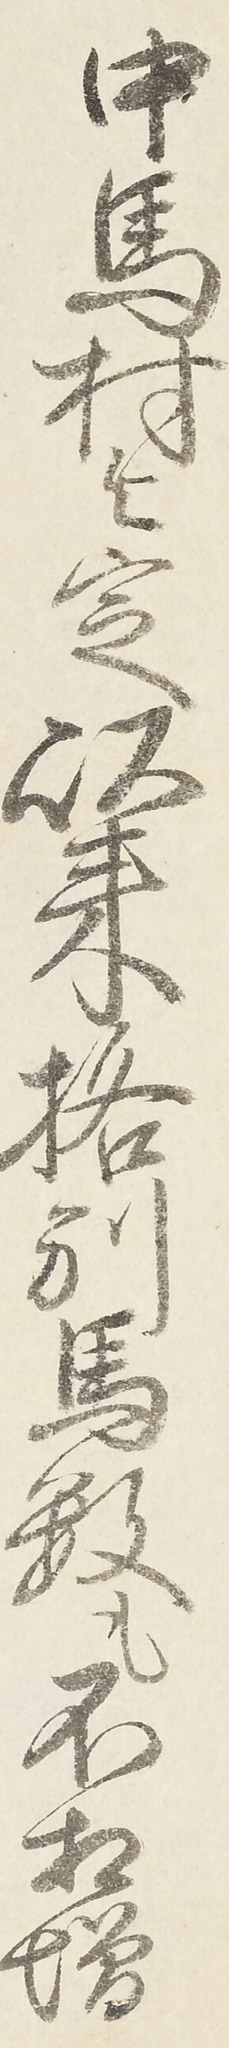中馬村と定以来格別馬数も不相増
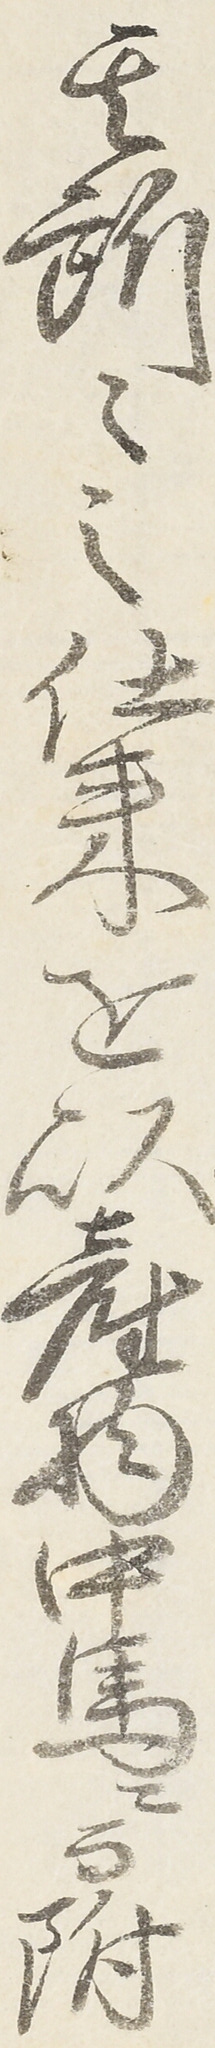其所々之仕来を以産物中馬ニ而附
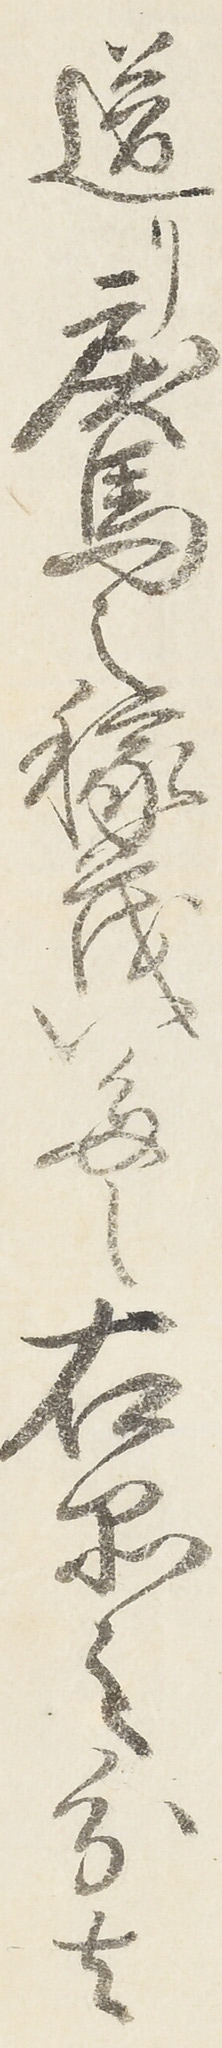送り戻馬之稼もいたし右品之分は
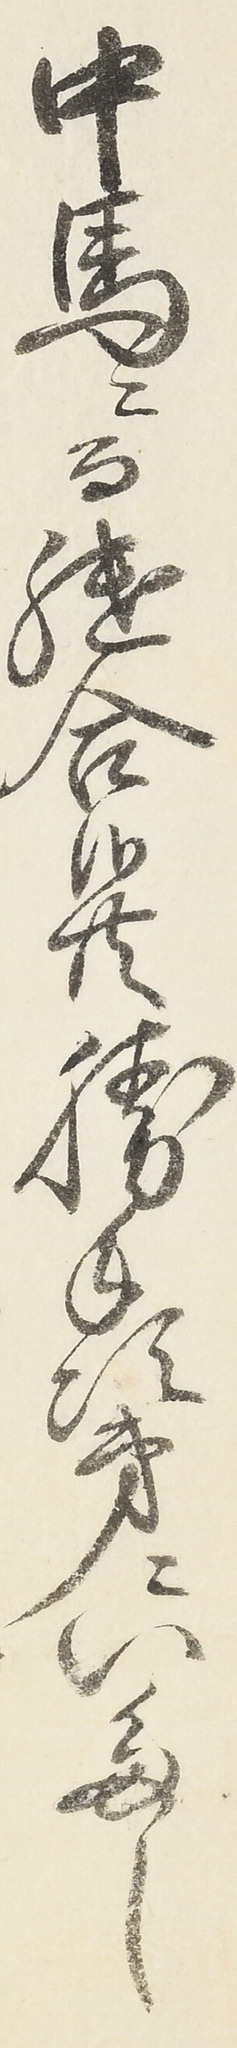中馬ニ而継合候共勝手次第ニいたし
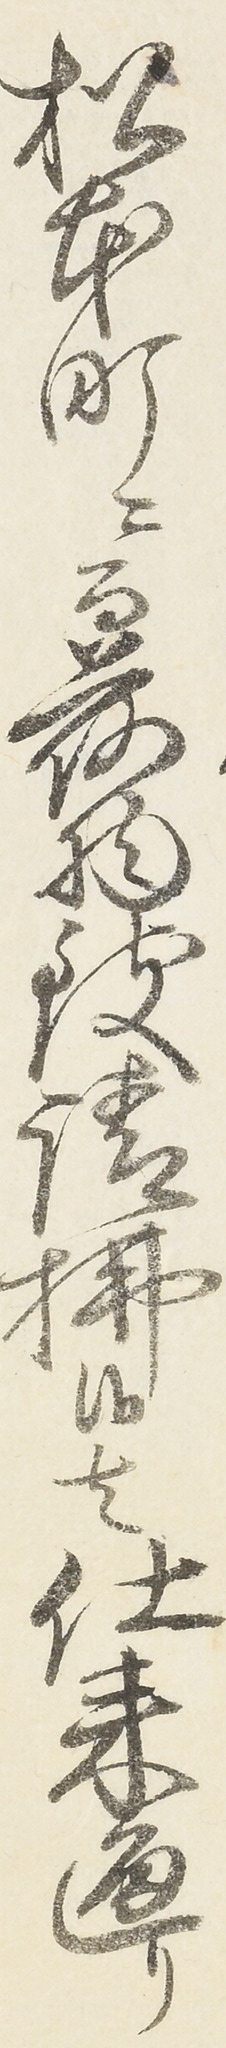松本町ニ而荷物致請払候は仕来通り
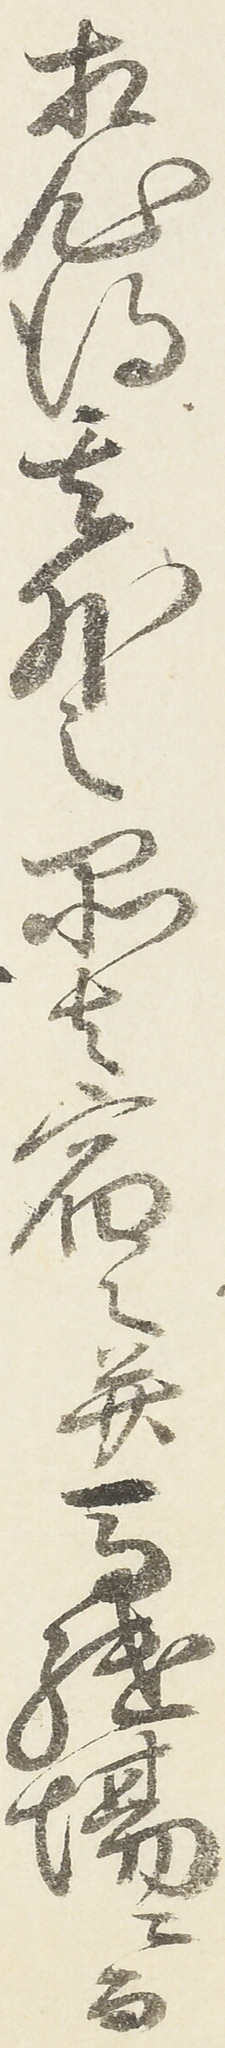相心得其外之品は宿々并馬継場ニ而
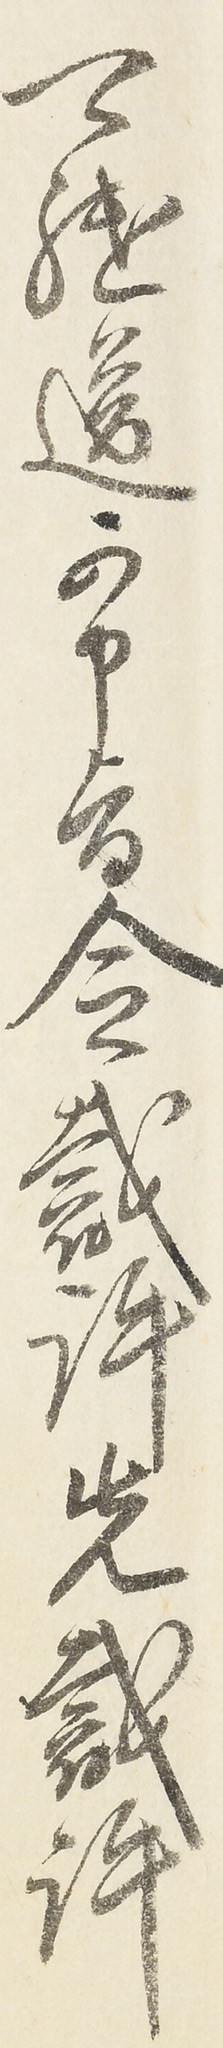可継送可申旨令裁許先裁許
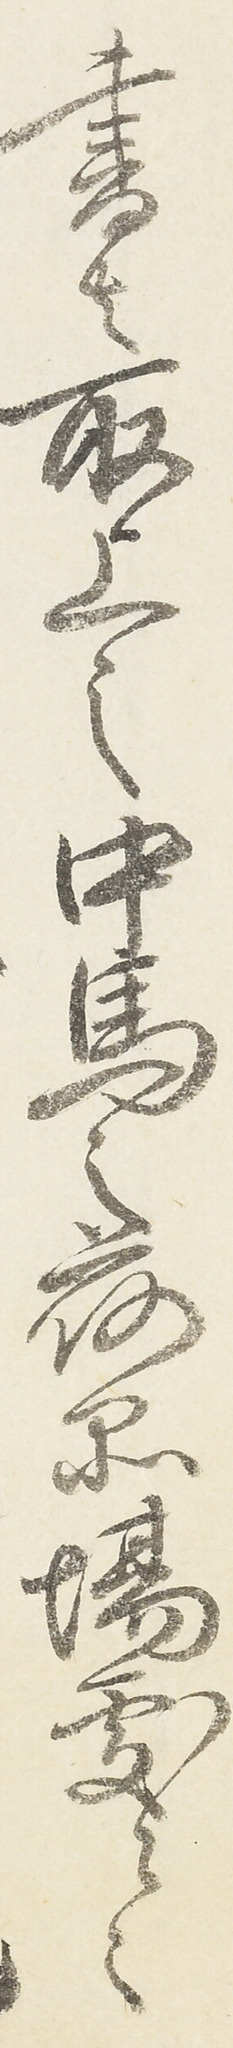書は取上之中馬之荷品場処々々
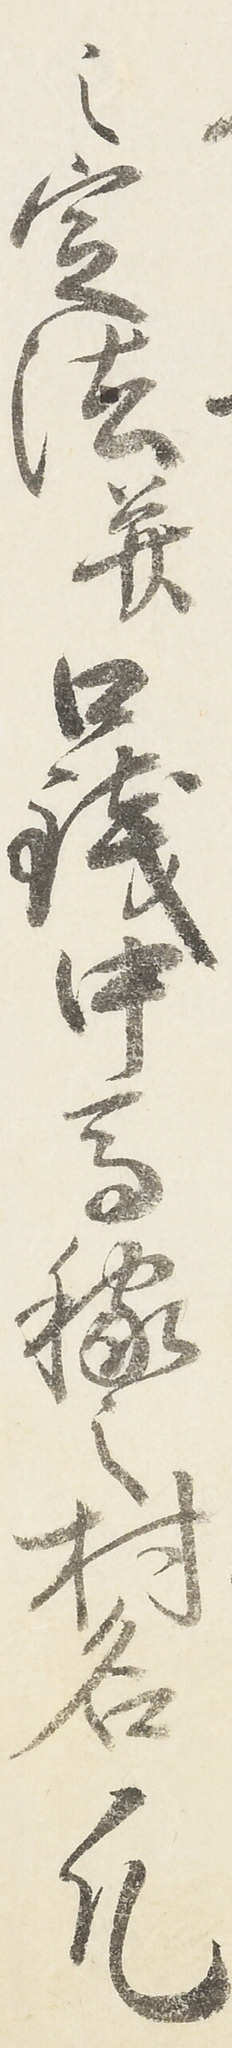之定法并口銭中馬稼之村名凡
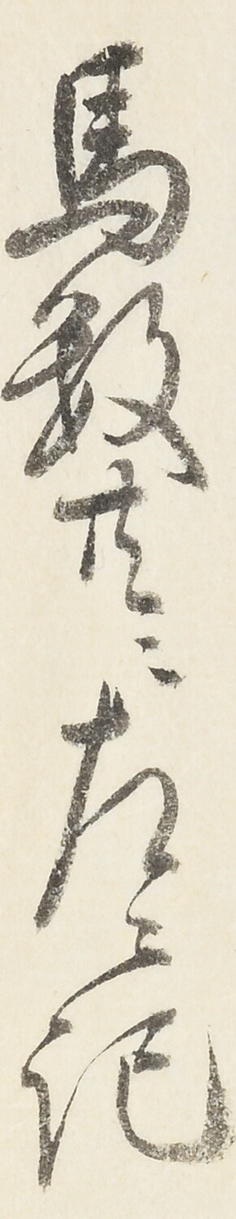馬数共ニ左ニ記
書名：中馬御裁許帳面
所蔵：伊那市立高遠町図書館・合同会社AMANE
